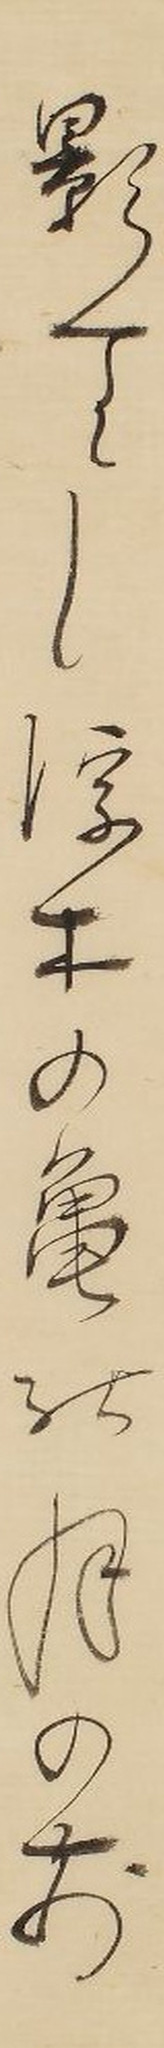影すえし浮木の亀の月の前
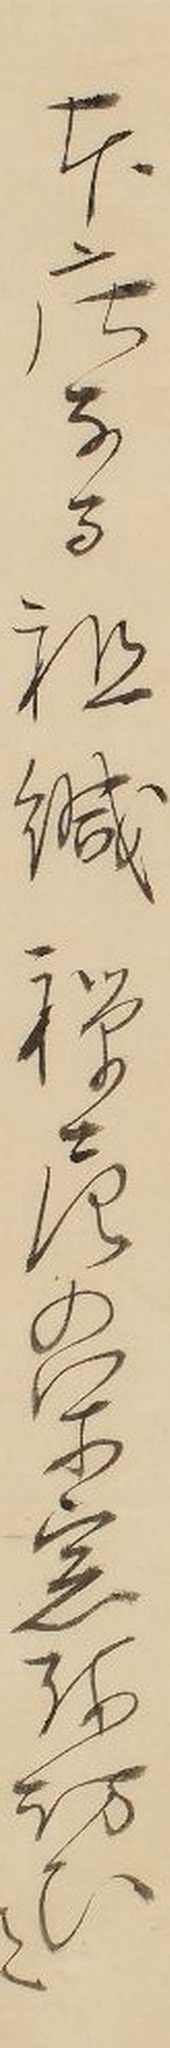本庄なる祖緘禅尼の閑窓を訪ひて
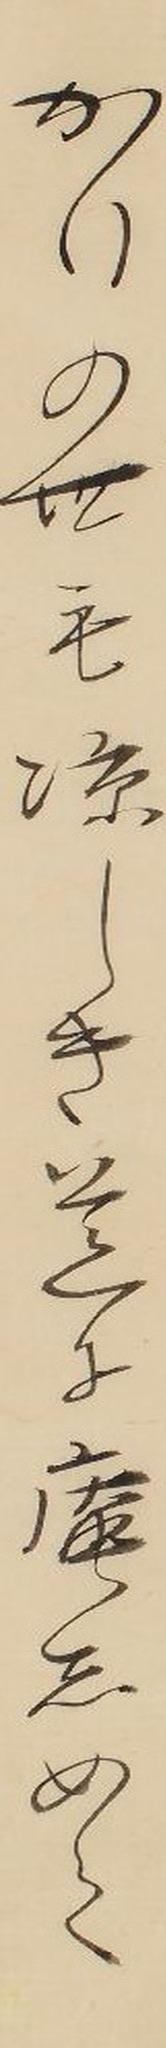かりの世も涼しき道に庵しめて
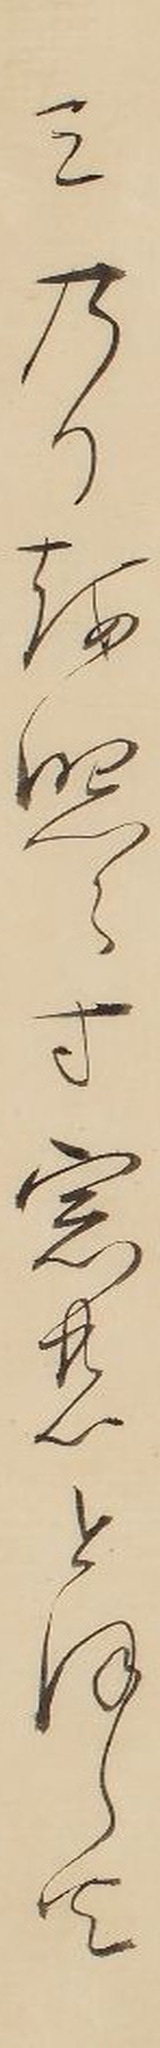みのりを照らす窓のとほし火
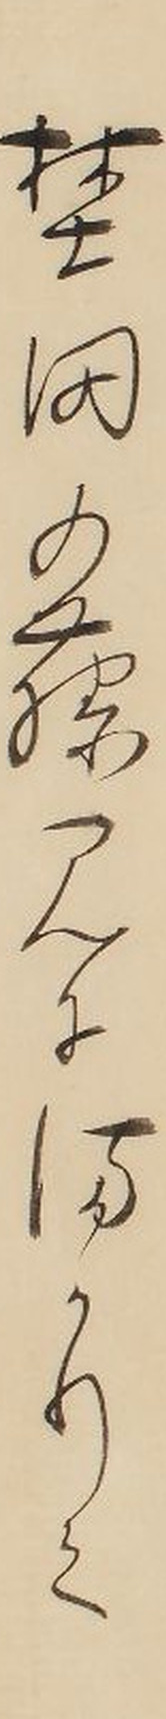野田の藤見にまかりて
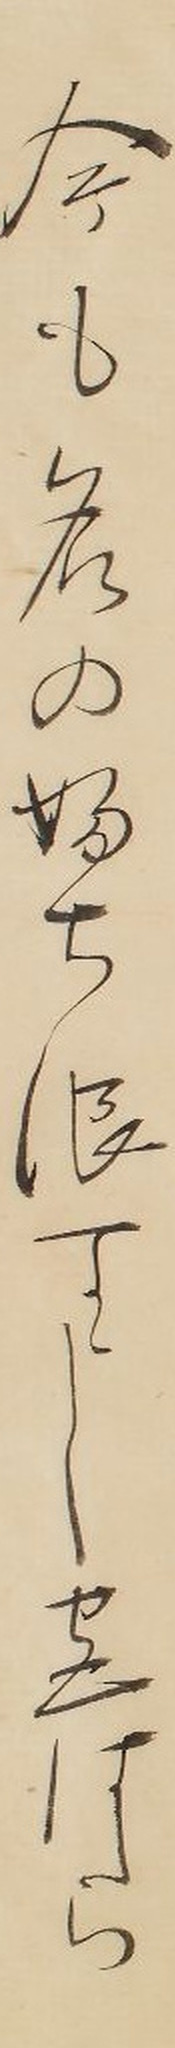今も名のふち浪すゝし宮はしら
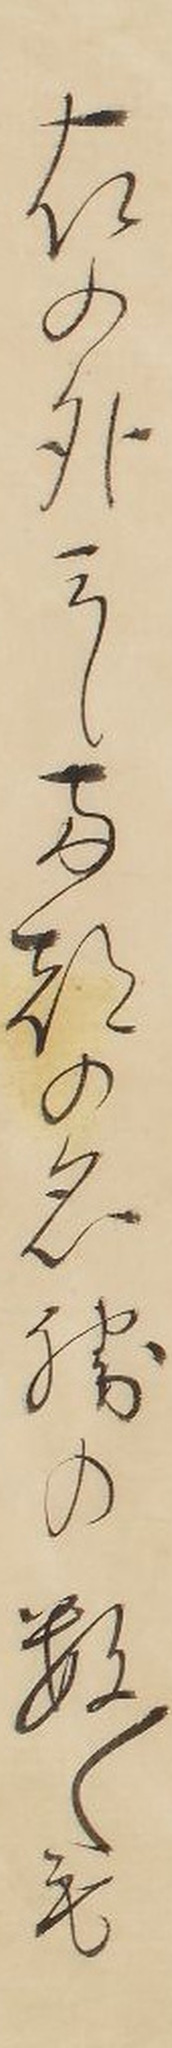右の外みし両都の名勝の数〳〵も
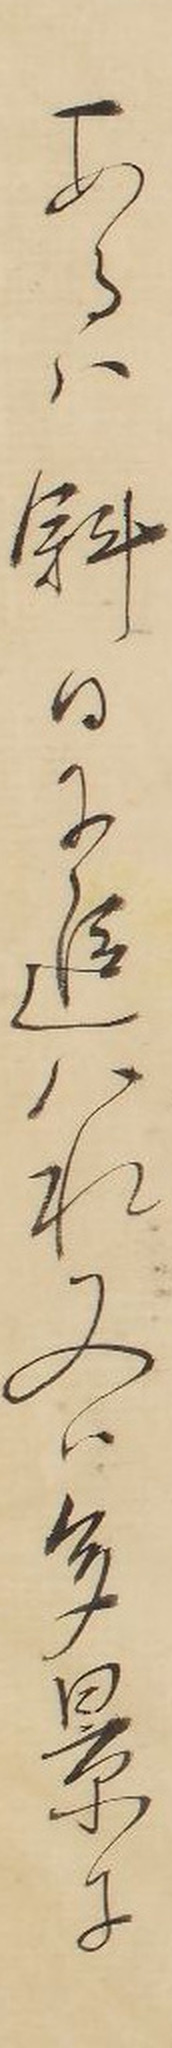あるは斜日に追はれ又は多景に

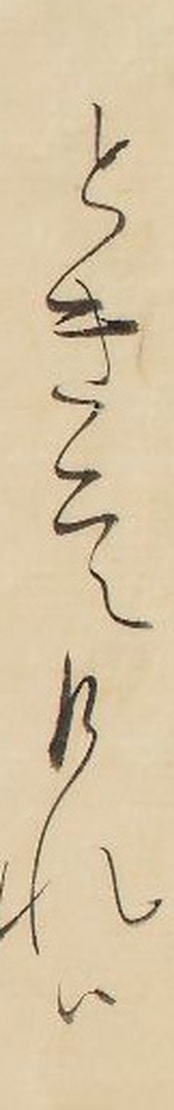ときこえけれは
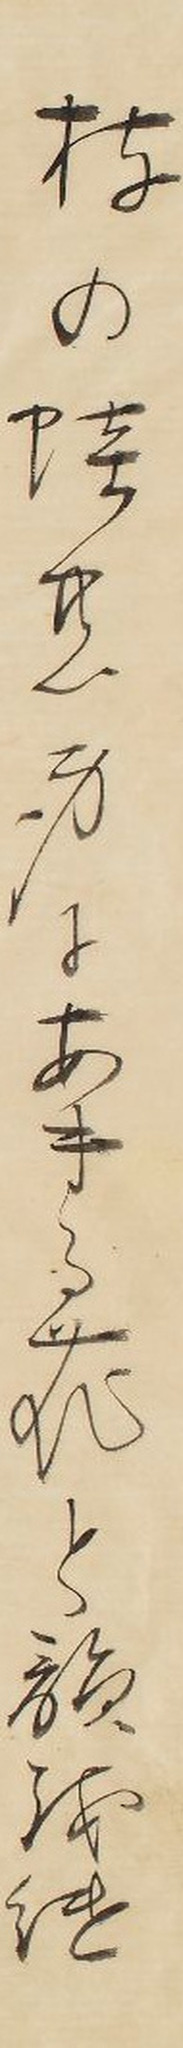枝の蛙の身にあまる花と韻を継
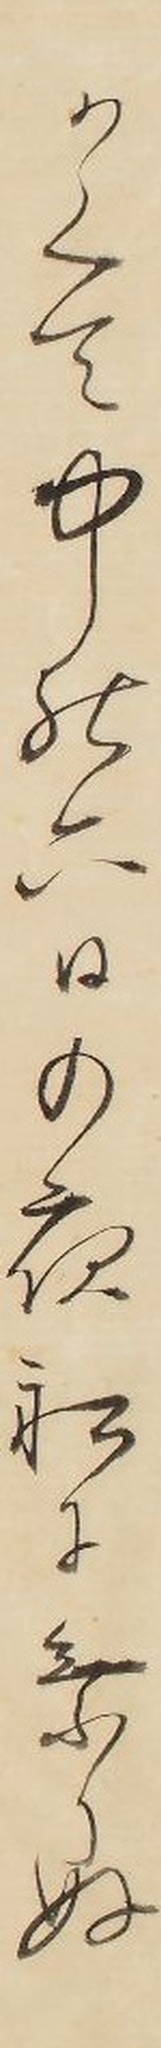かくて中の六日の夜船に乗りぬ
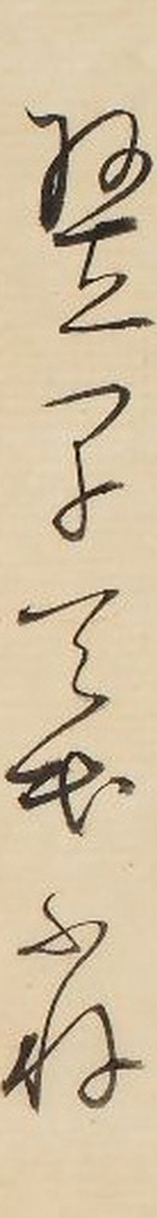翌早天出ふね
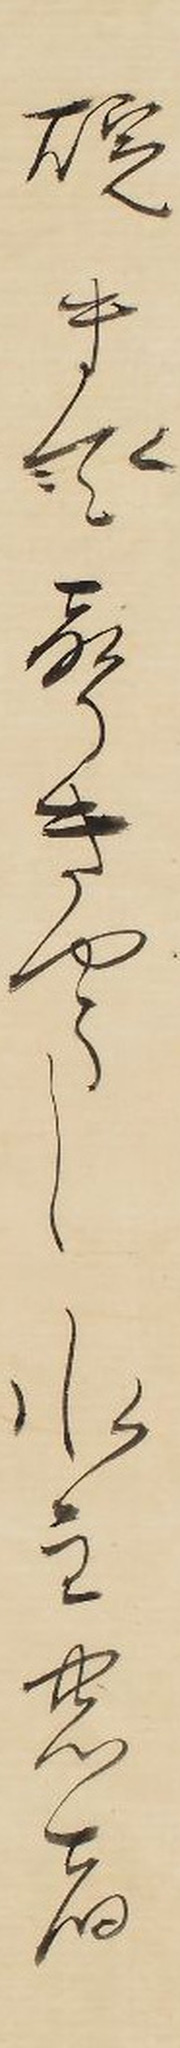碇まく聲きやうし水主の者
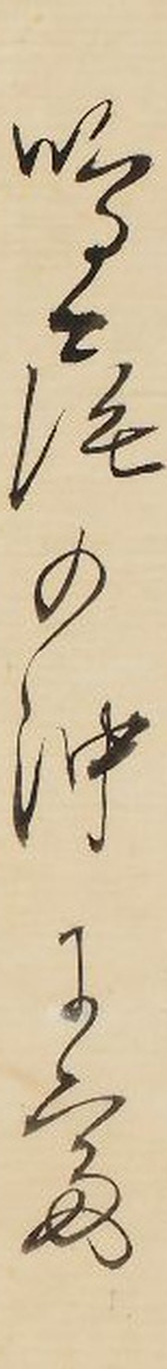鳴尾の沖にて
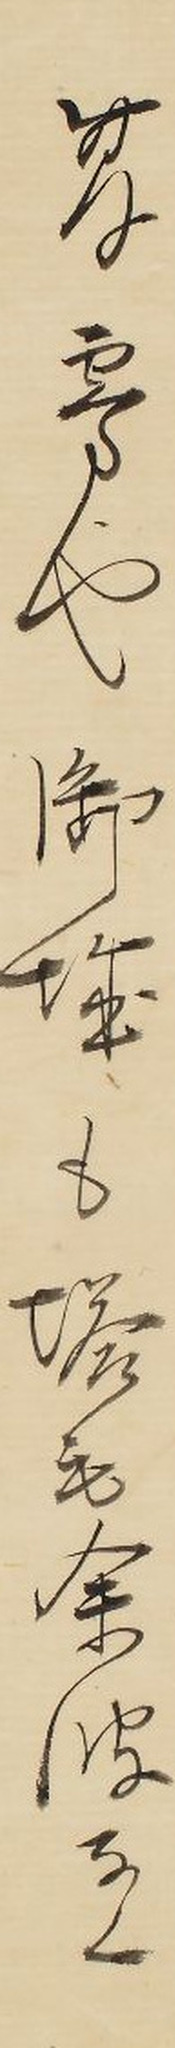夏雲や御城も塔も余波なく
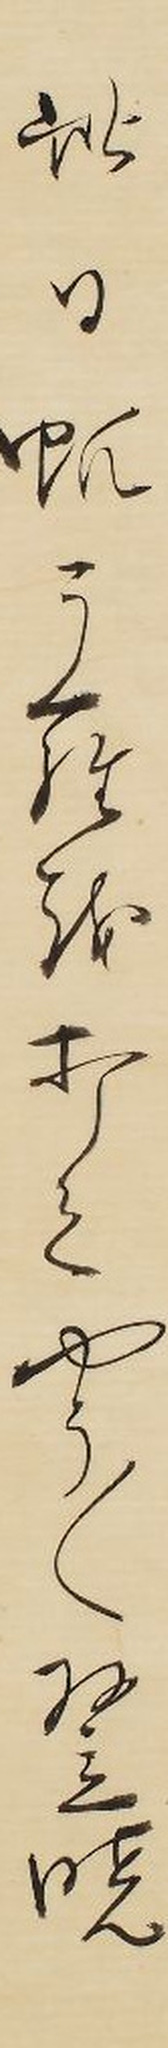此日帆うらを打てやう〳〵翌暁
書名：花土産
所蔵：徳島県立図書館
